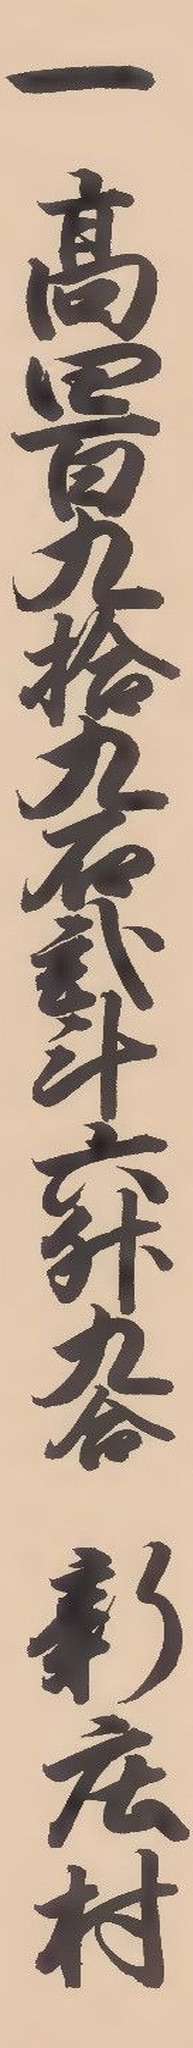一高四百九拾九石弐斗六升九合新庄村
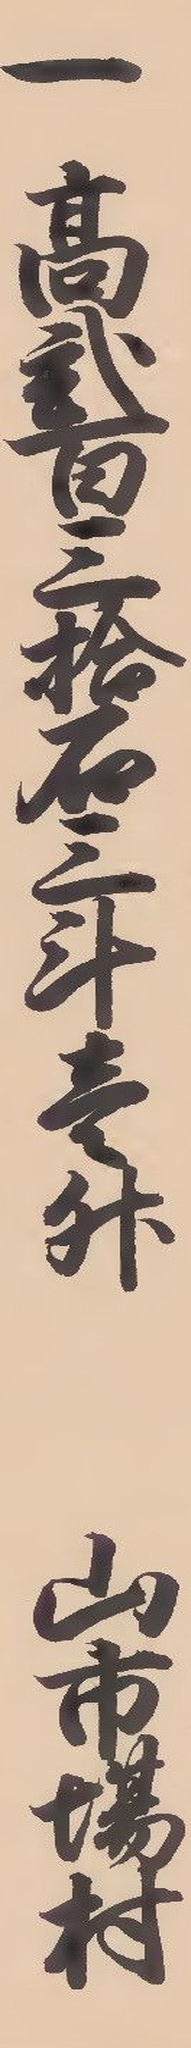一高弐百三拾石三斗壱升山市場村

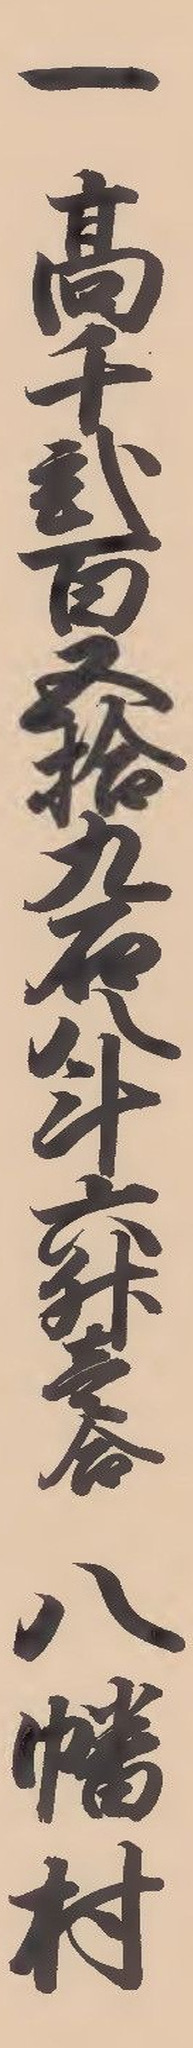一高千弐百五拾九石八斗六升壱合八幡村
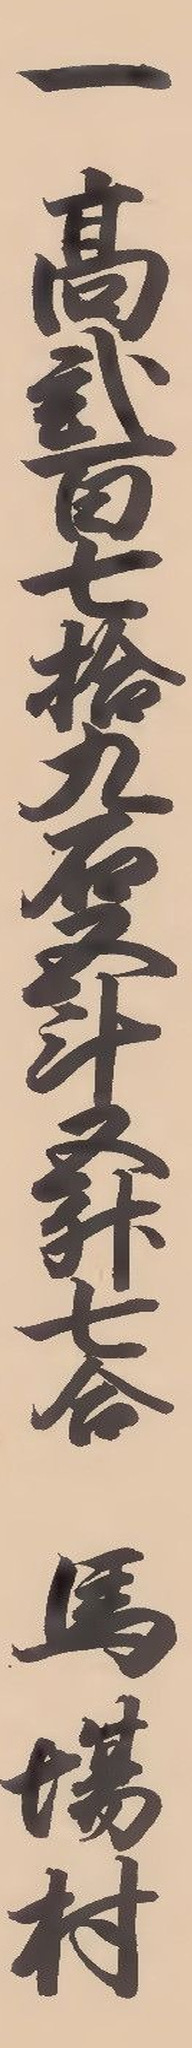一高弐百七拾九石五斗五升七合馬場村
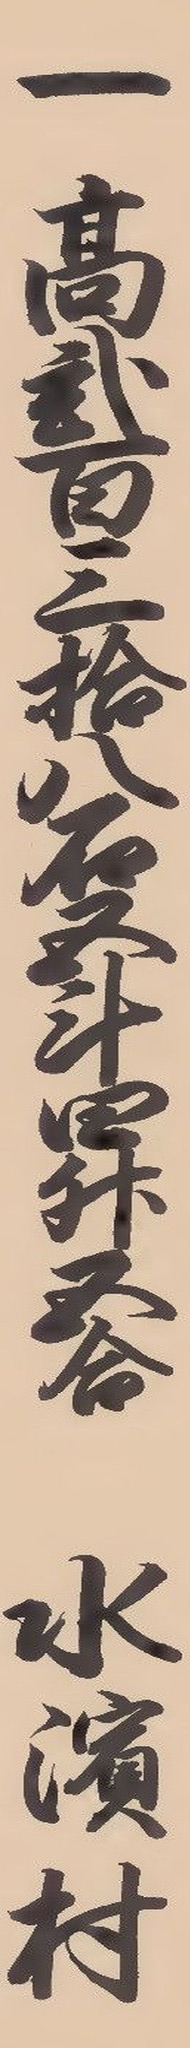一高弐百三拾八石五斗四升五合水浜村
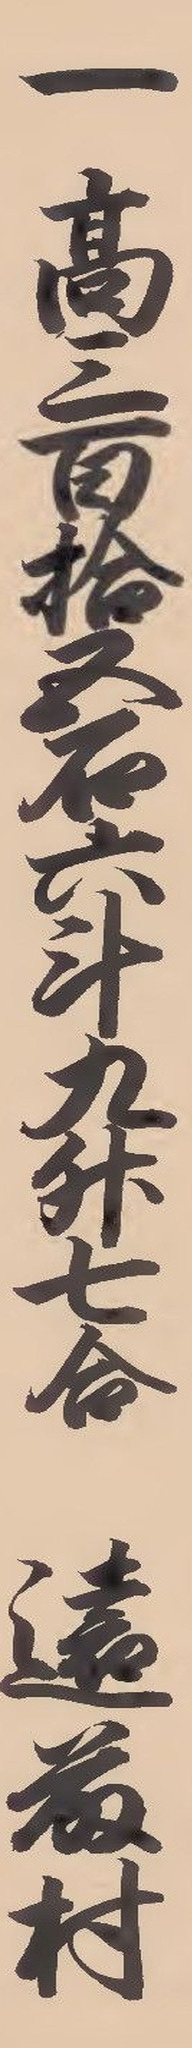一高三百拾五石六斗九升七合遠藤村
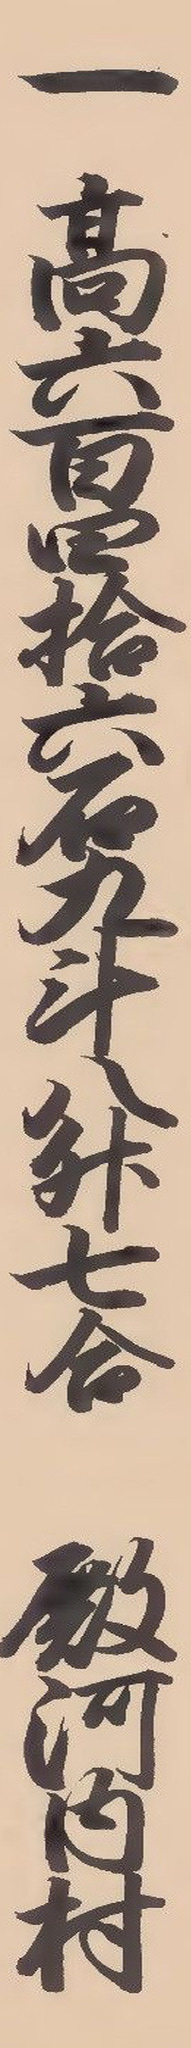一高六百四拾六石九斗八升七合殿河内村
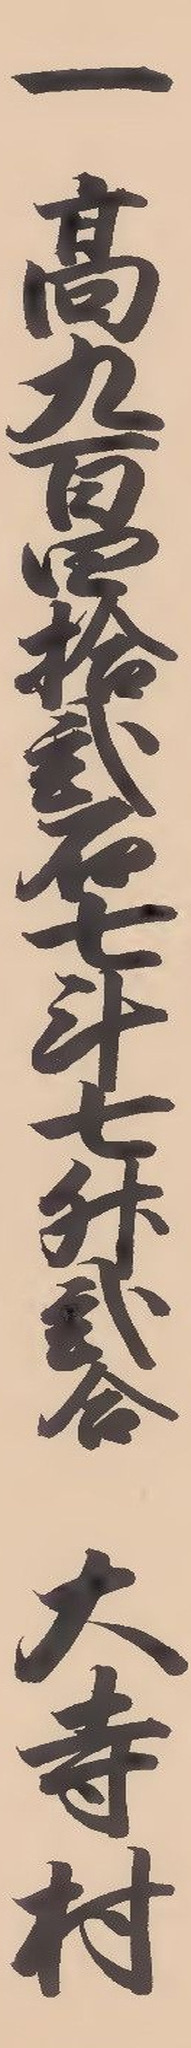一高九百四拾弐石七斗七升弐合大寺村
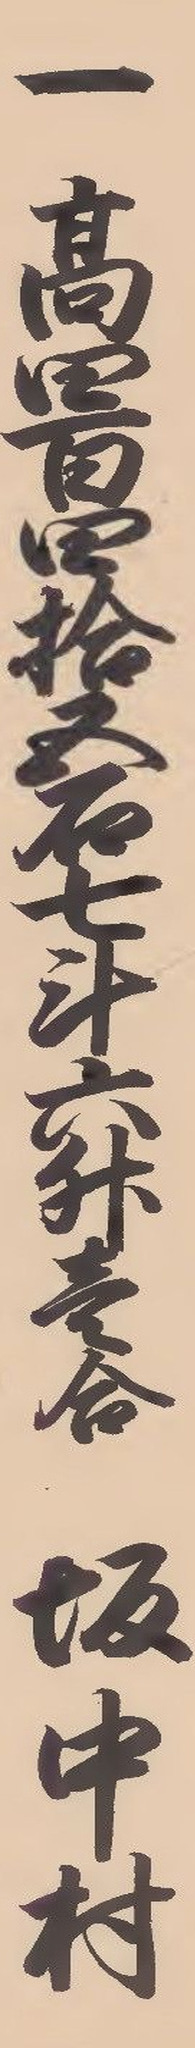一高四百四拾五石七斗六升壱合坂中村

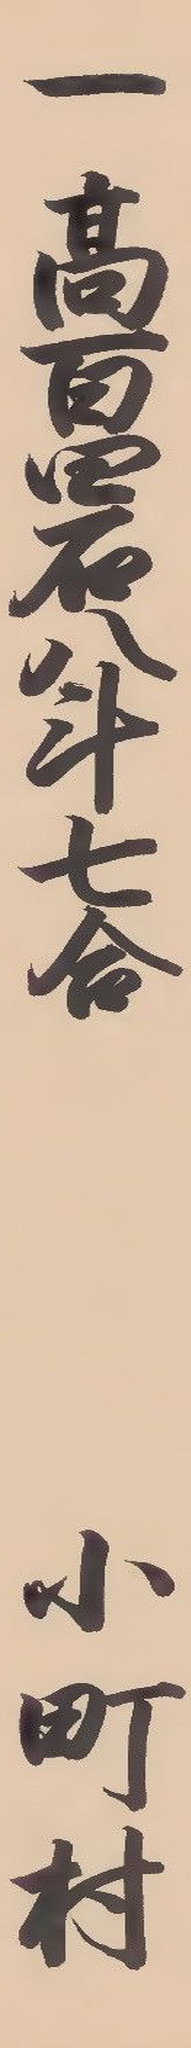一高百四石八斗七合小町村
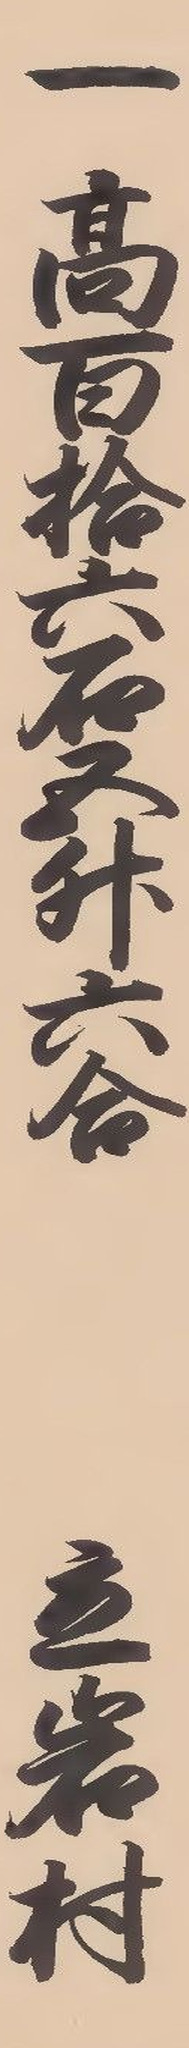一高百拾六石五升六合立岩村
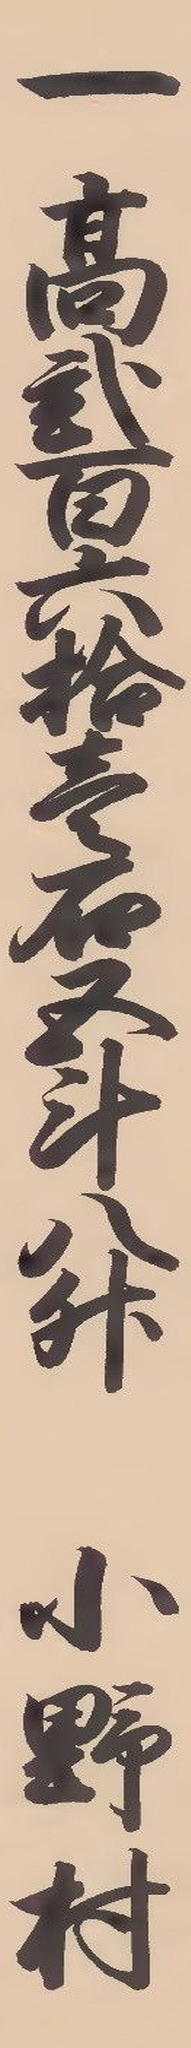一高弐百六拾壱石五斗八升小野村
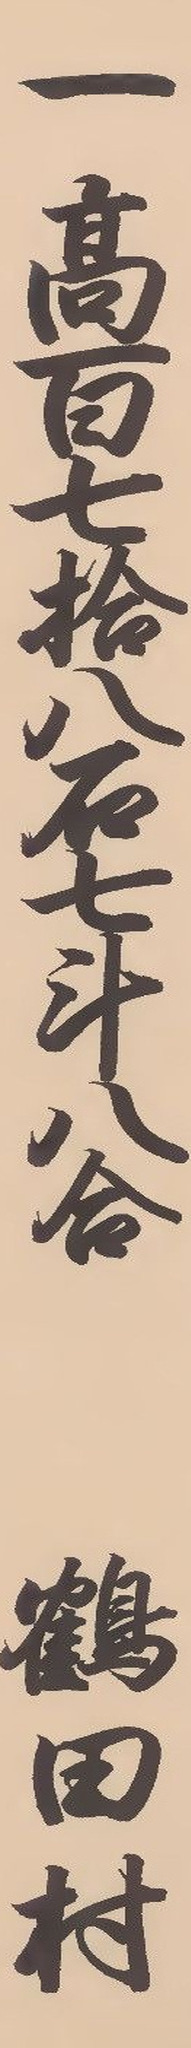一高百七拾八石七斗八合鶴田村
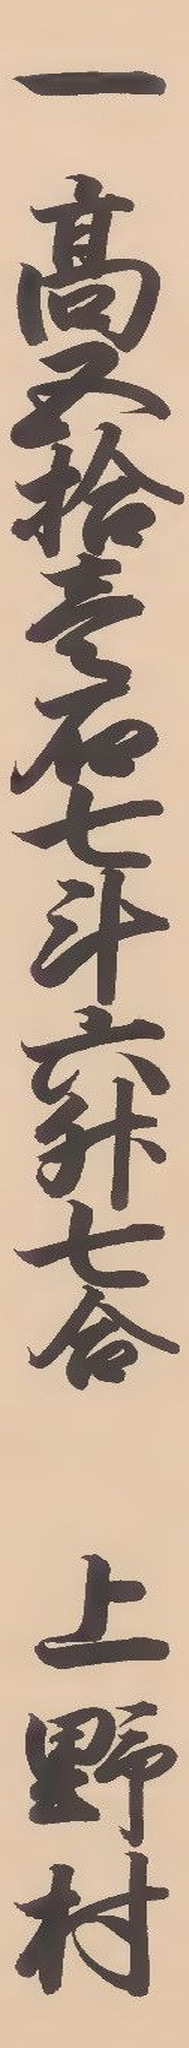一高五拾壱石七斗六升七合上野村
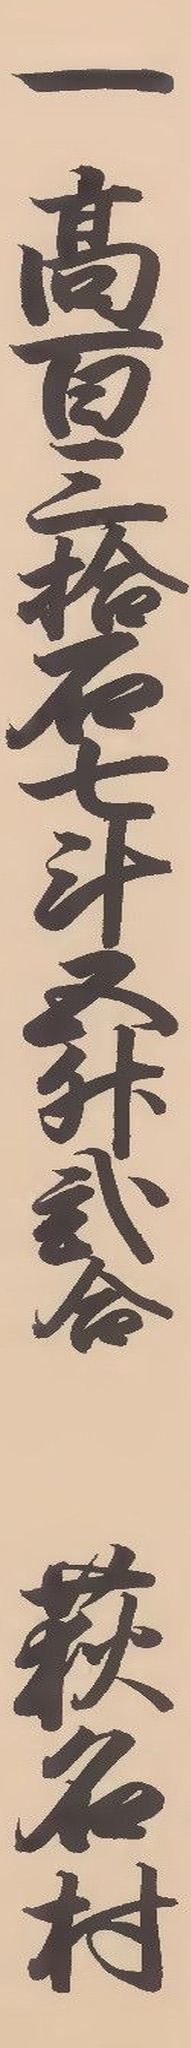一高百三拾石七斗五升弐合荻名村
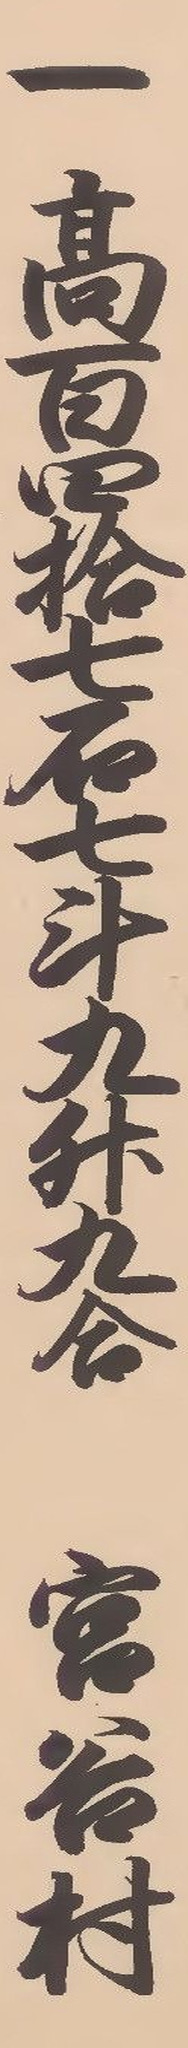一高百四拾七石七斗九升九合宮谷村
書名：伯耆国郷帳
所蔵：国立公文書館 National Archives of Japan
